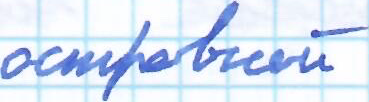островной
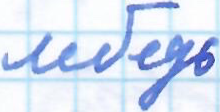лебедь
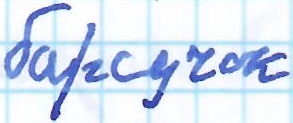барсучок
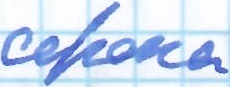сорока
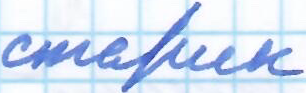старик
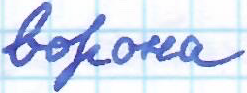ворона
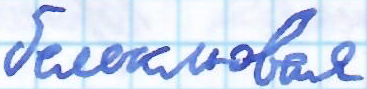белоклювая
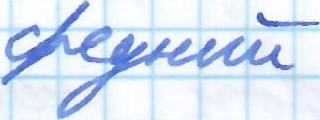средний
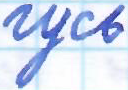гусь
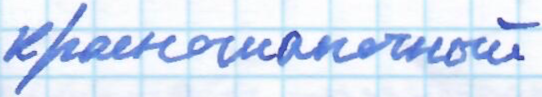красношапочный
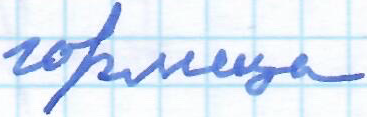горлица
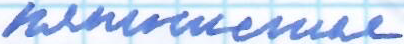пятнистая
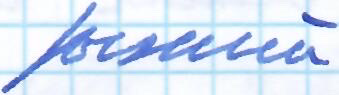рыжий
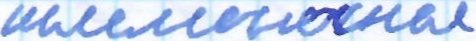шлемоносная
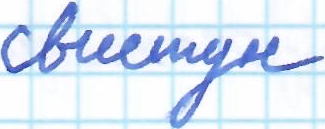свистун
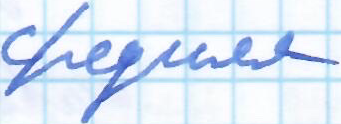средняя
